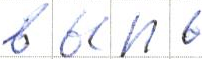выпь
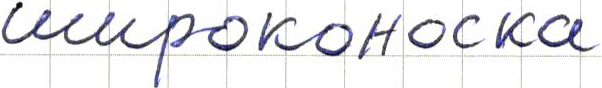широконоска
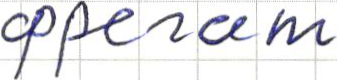фрегат
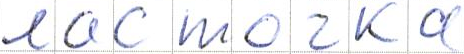ласточка
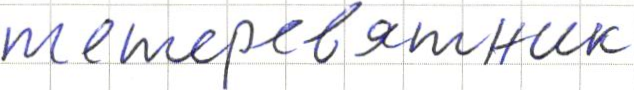тетеревятник
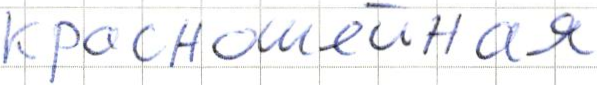красношейная
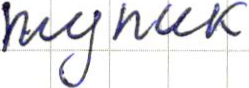тупик
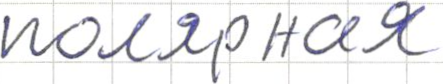полярная
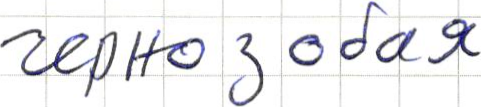чернозобая
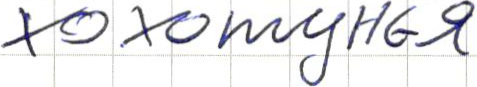хохотунья
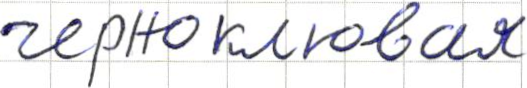черноклювая
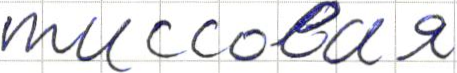тиссовая
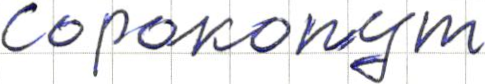сорокопут
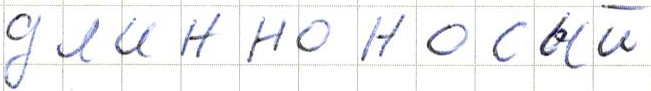длинноносый
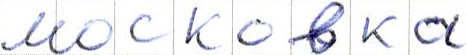московка
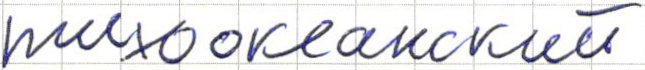тихоокеанский
